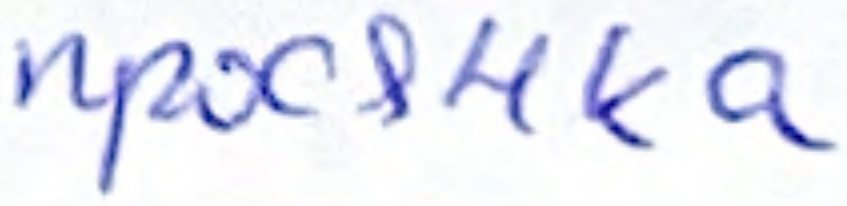просянка
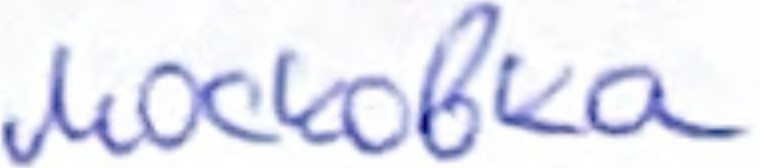московка
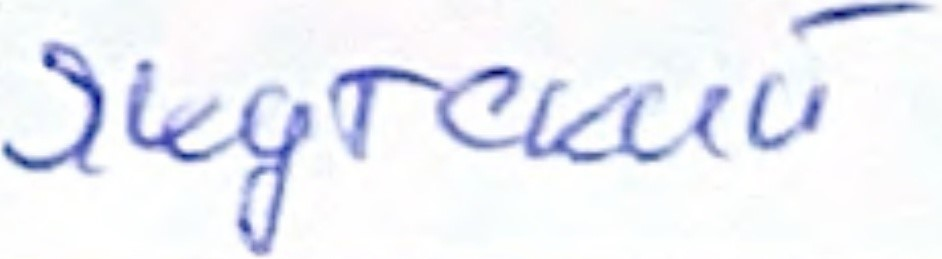якутский
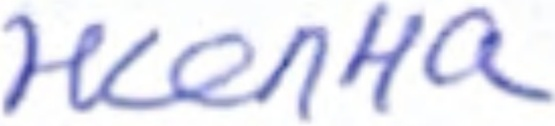желна
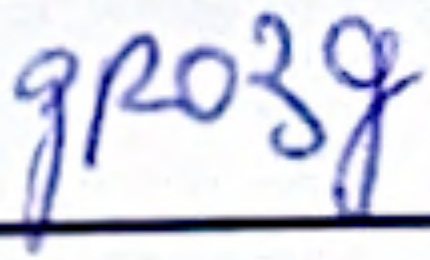дрозд
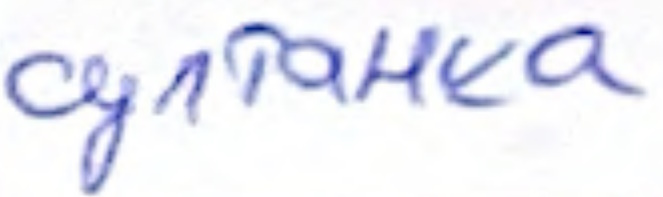султанка
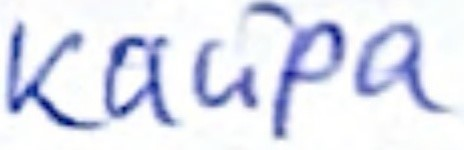кайра
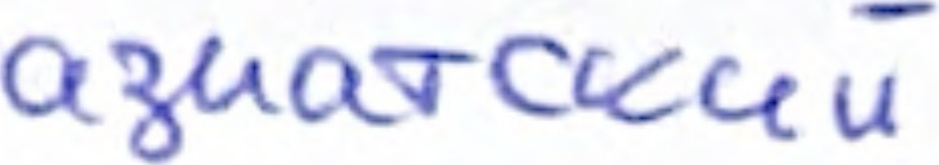азиатский
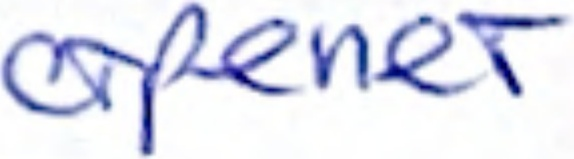стрепет
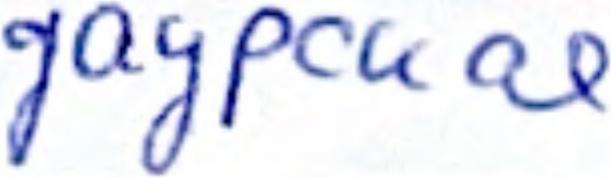даурская
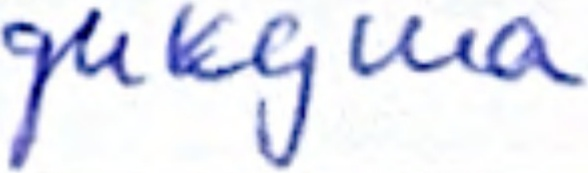дикуша
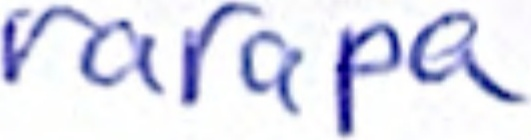гагара
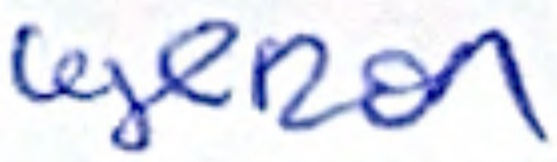щегол
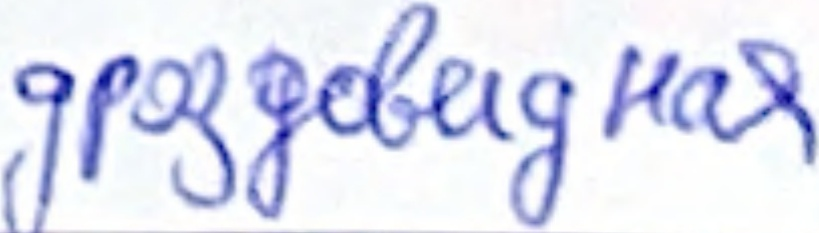дроздовидная
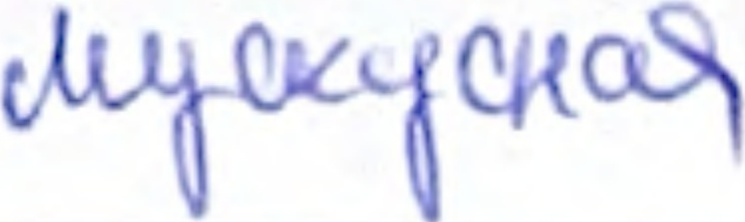мускусная
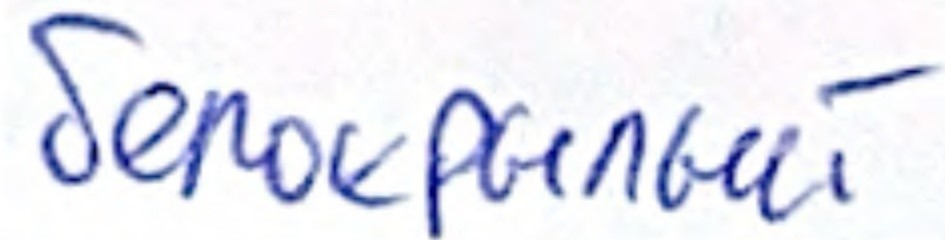белокрылый
